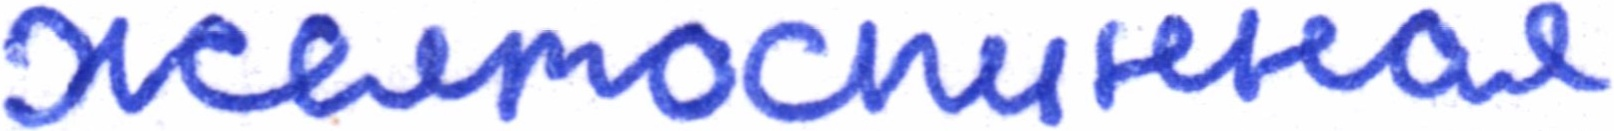желтоспинная
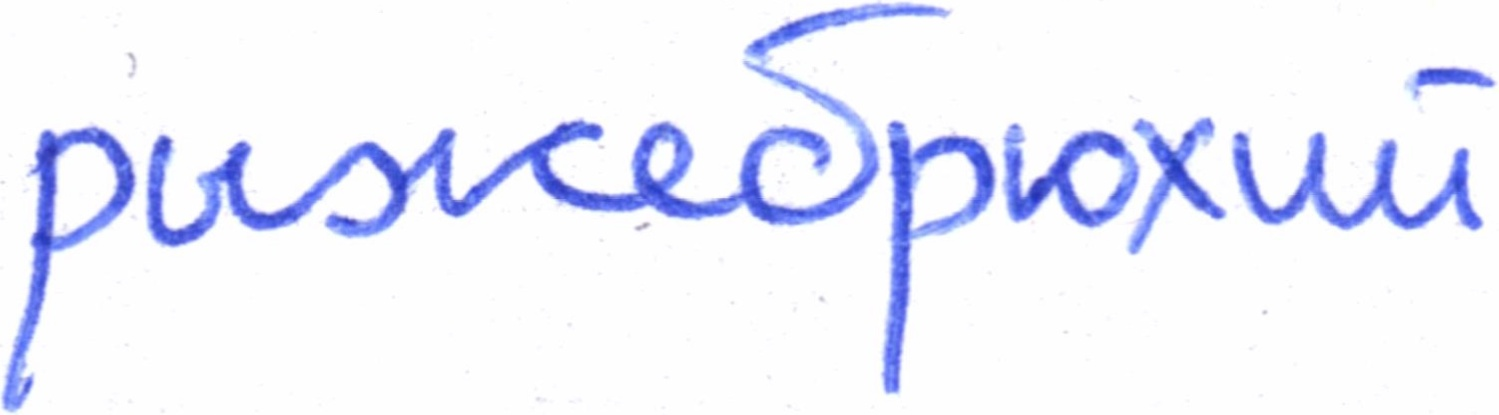рыжебрюхий
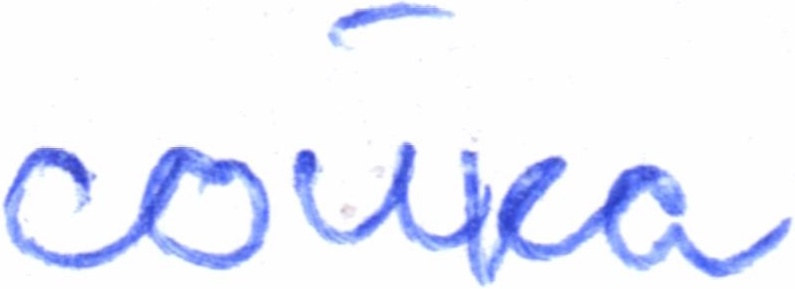сойка
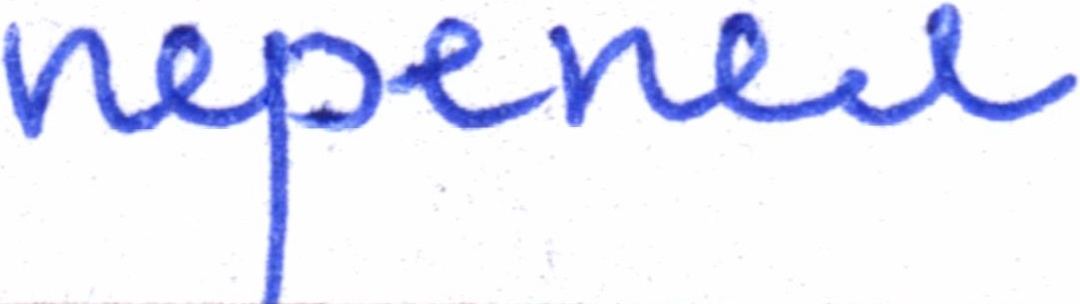перепел
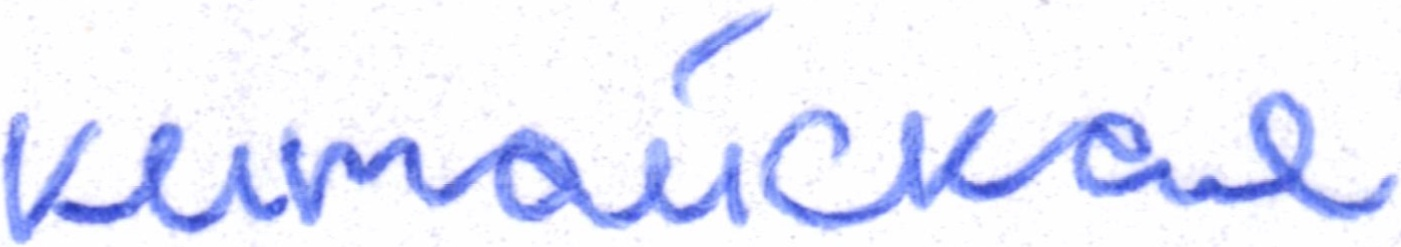китайская
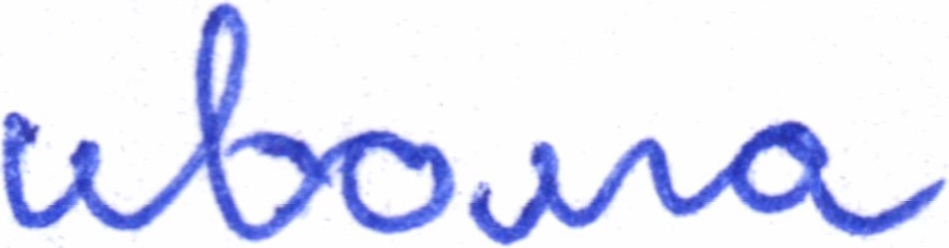иволга
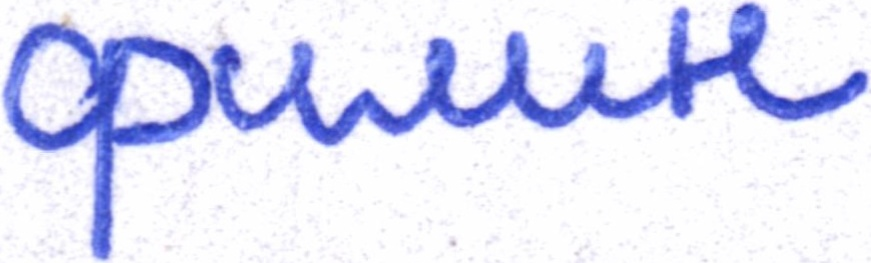филин
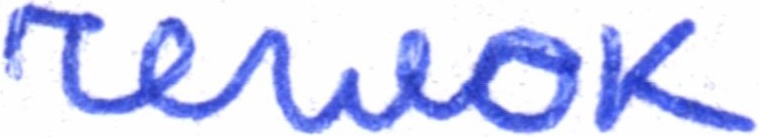чеглок
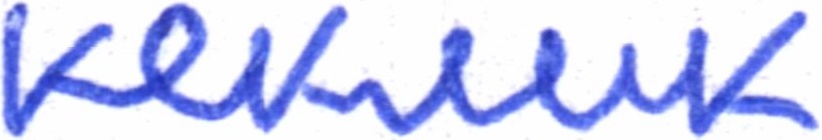кеклик
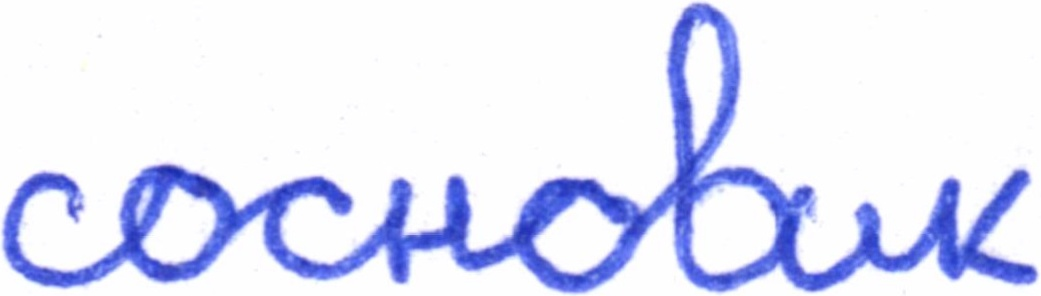сосновик
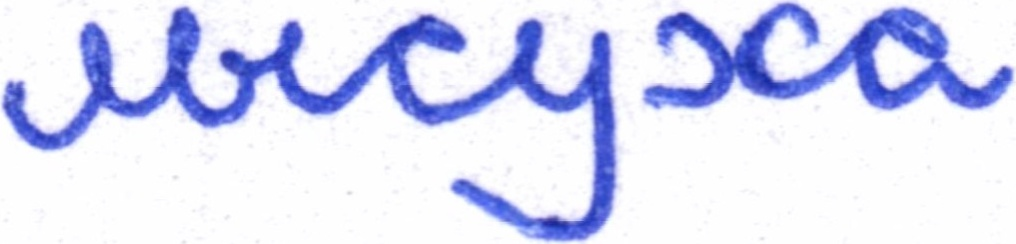лысуха
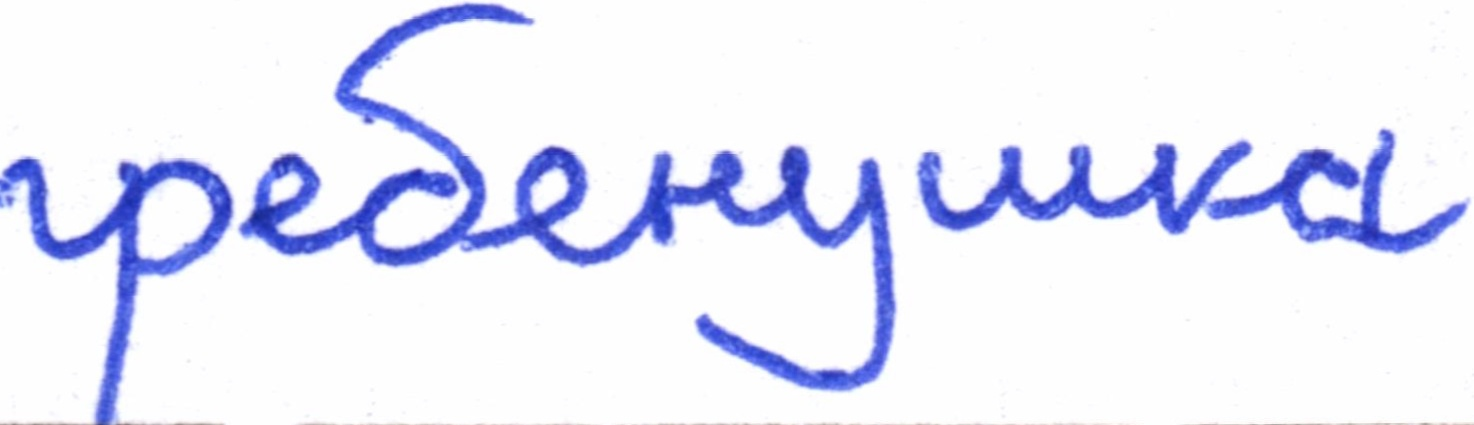гребенушке
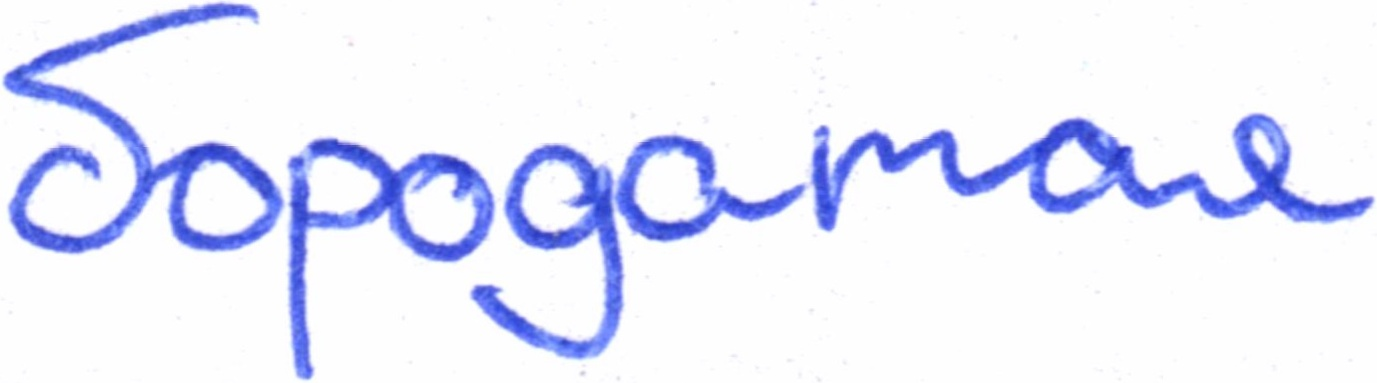бородатая
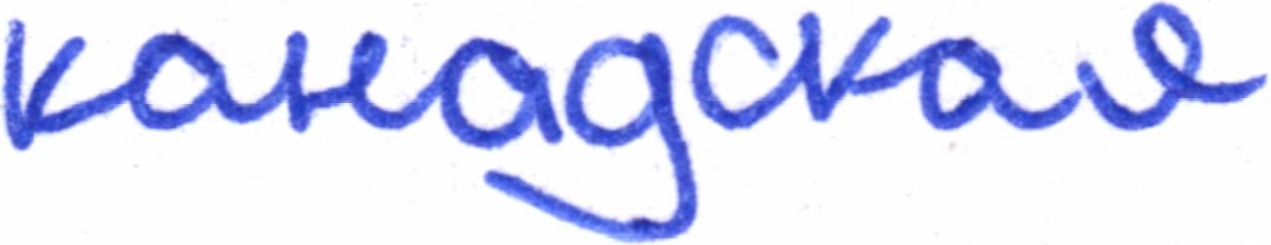канадская
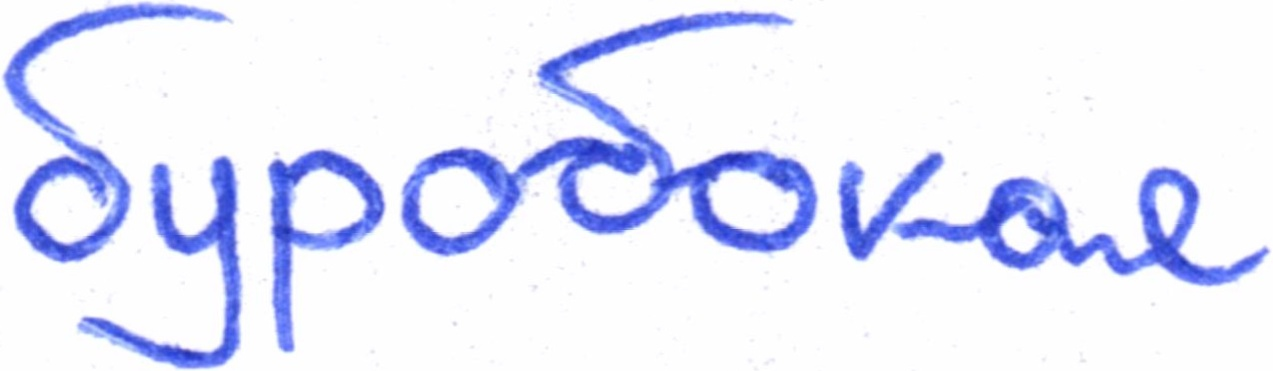буробокая
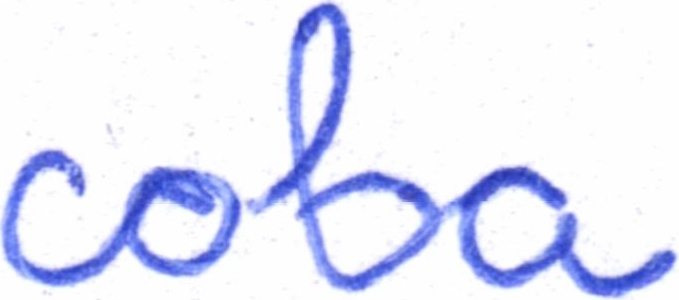сова
